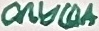олуша
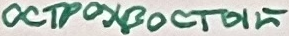острохвостый
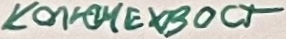колючехвост
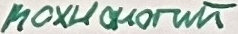мохноногий
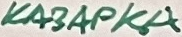казарка
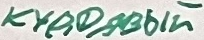кудрявый
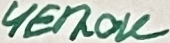чеглок
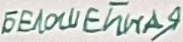белошейная
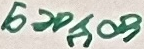бэрдов
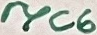гусь
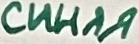синяя
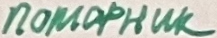поморник
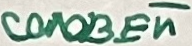соловей
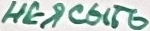неясыть
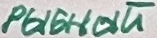рыбный
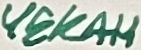чекан
